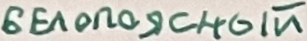белопоясный
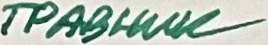травник
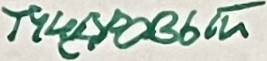тундровый
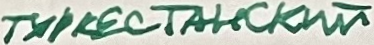туркестанский
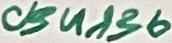свиязь
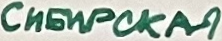сибирская
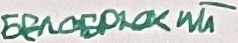белобрюхий
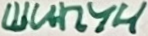шипун
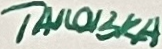таловка
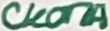скопа
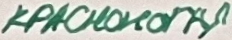красноногая
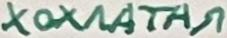хохлатая
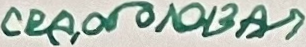седоголовая
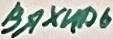вяхирь
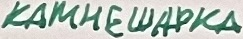камнешарка
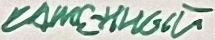каменный
